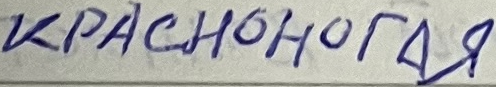красноногая
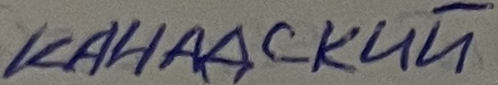канадский
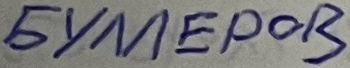буллеров
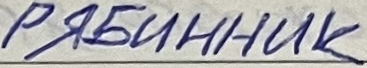рябинник
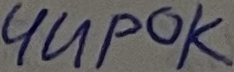чирок
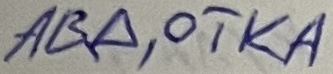авдотка
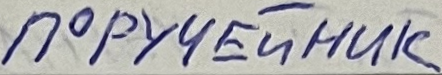поручейник
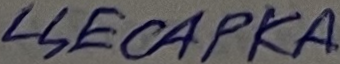цесарка
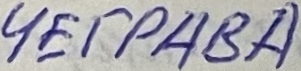чеграва
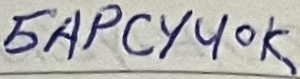барсучок
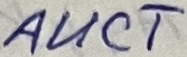аист
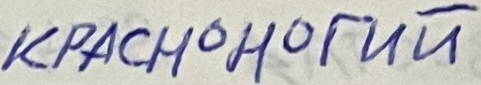красноногий
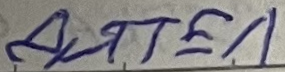дятел
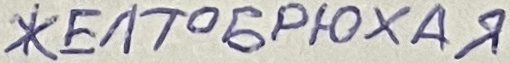желтобрюхая
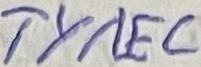тулес
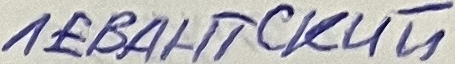левантский
